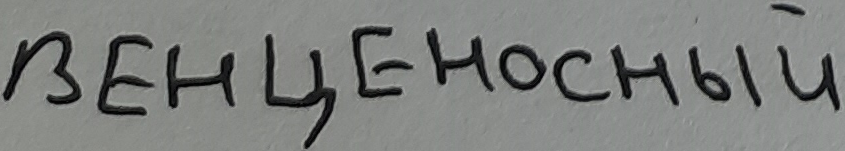венценосный
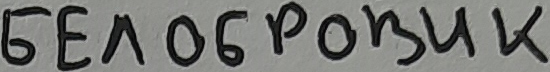белобровик
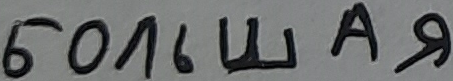большая
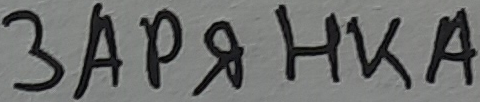зарянка
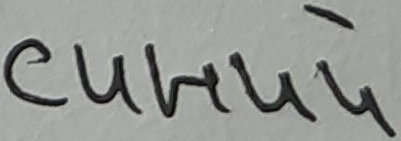синий
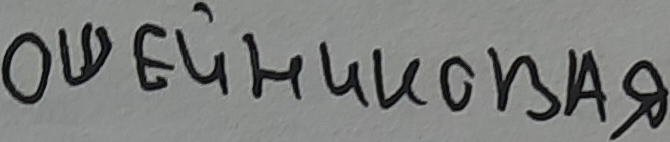ошейниковая
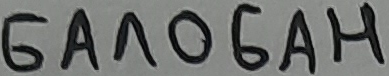балобан
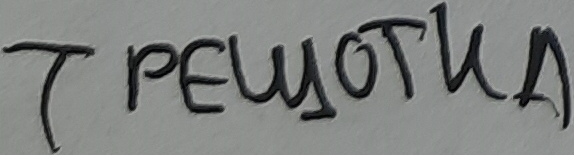трещотка
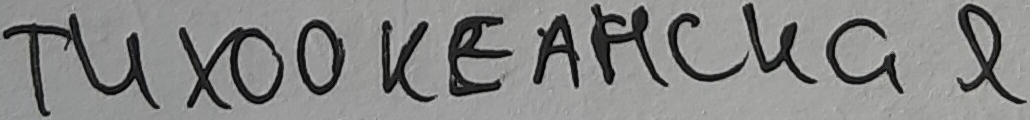тихоокеанская
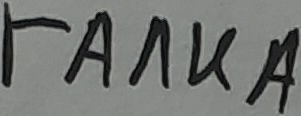галка
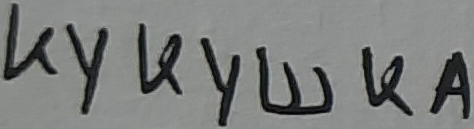кукушка
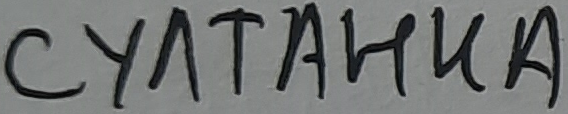султанка
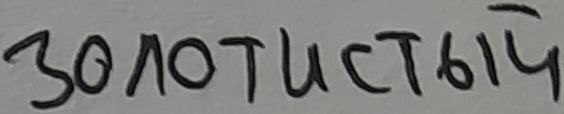золотистый
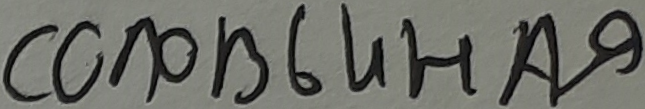соловьиная
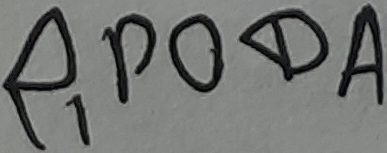дрофа
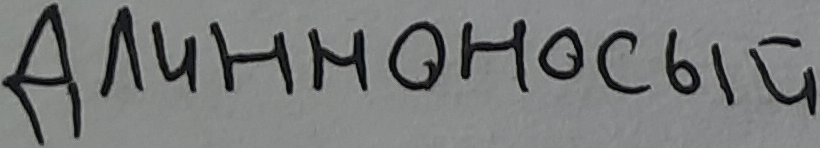длинноносый
